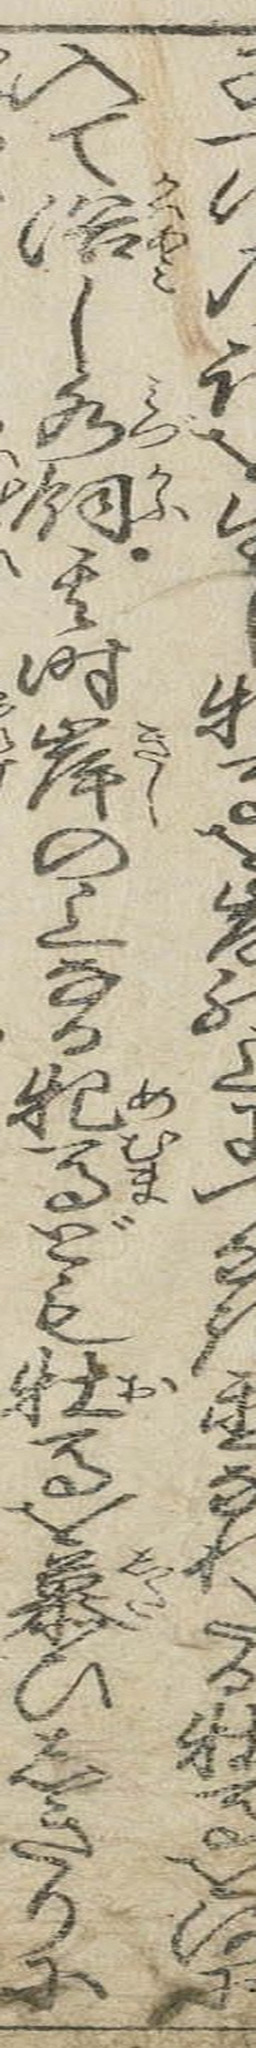入て浴し水飼。其時岸の上なる牝馬ども牡馬を慕ひしきりに
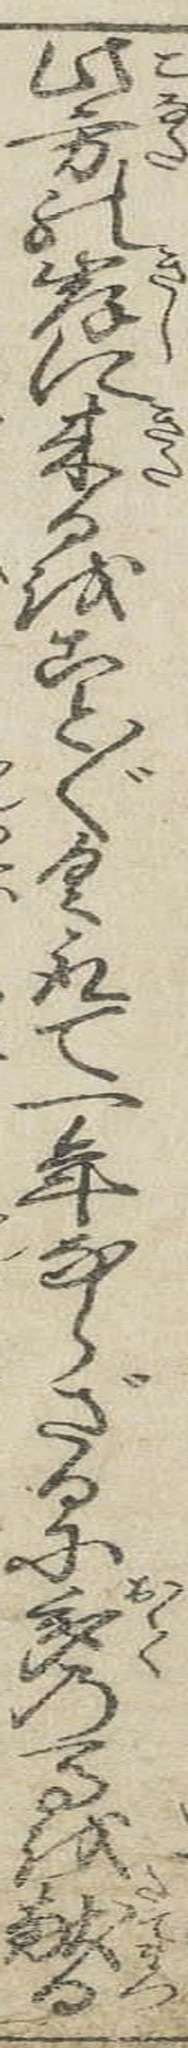此方の岸に来るをこと〴〵く取て一年ならざるに多の馬を献る
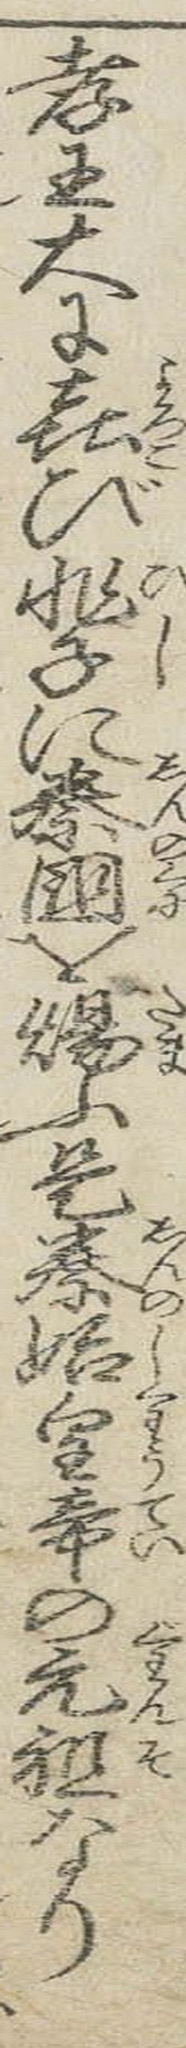孝王大に喜び非子に秦国を賜ふ是秦始皇帝の元祖なり
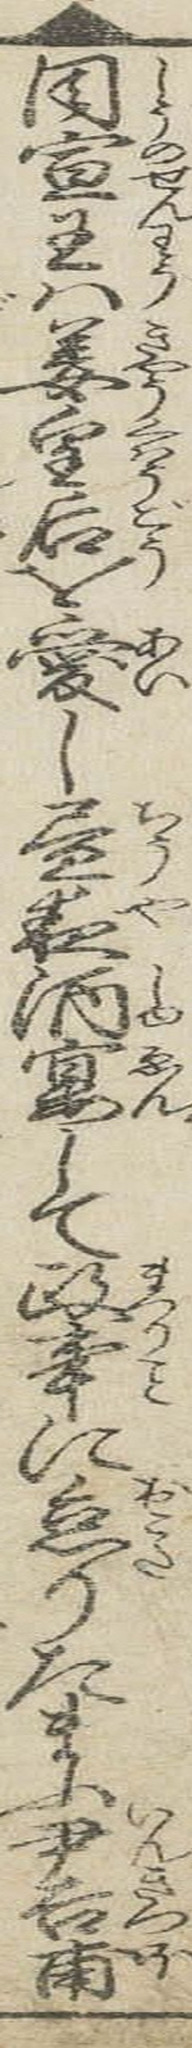周宣王は姜皇后を愛し昼夜酒宴して政事に怠りたまふ尹吉甫
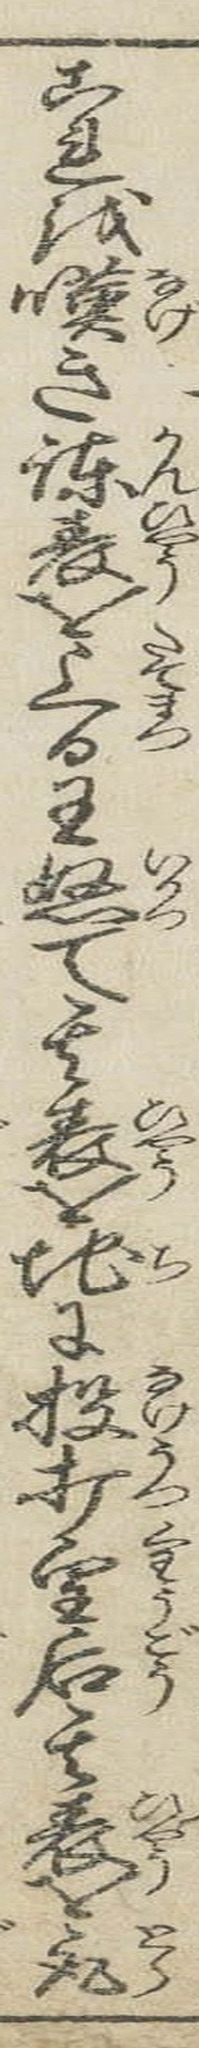これを嘆き諫表を上る王怒て其表を地に投打皇后其表を取
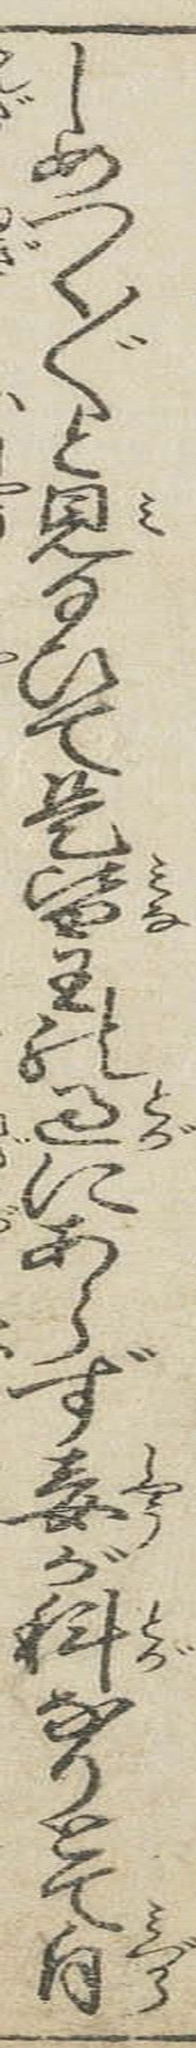しめつく〴〵と見給ひて是皆王の過にあらず妾が科なりとて自
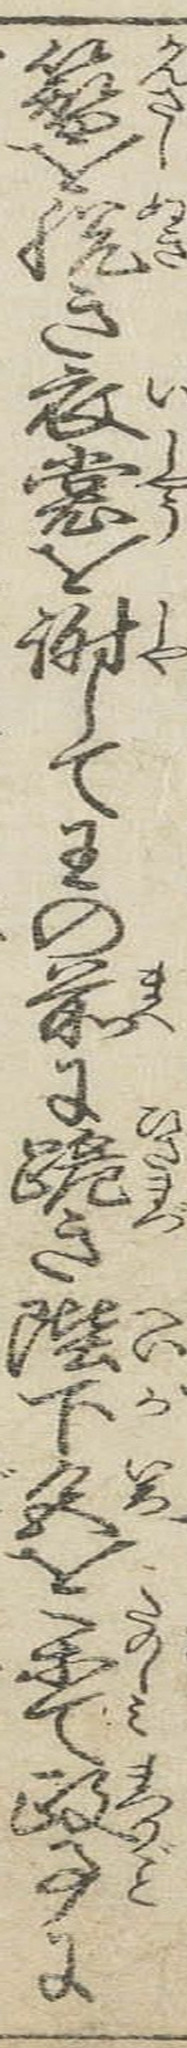簪を脱き衣裳を謝して王の前に跪き陛下色を楽て政事に
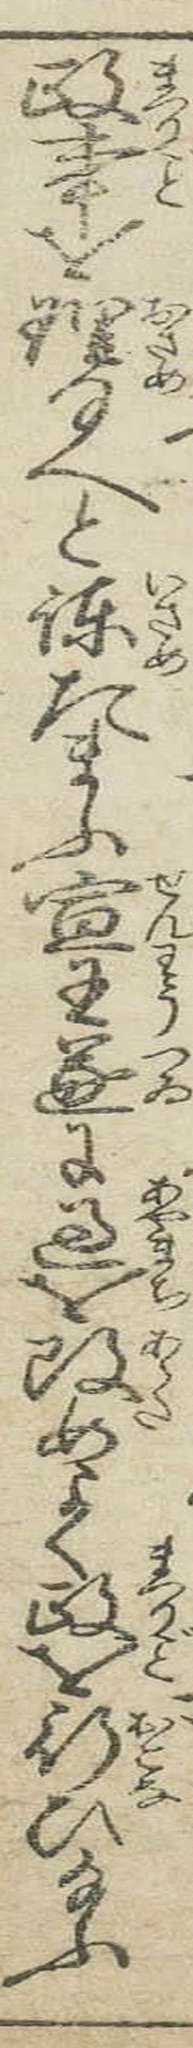政事を理給へと諫たまふ宣王遂に過を改めよく政を行ひ給ふ
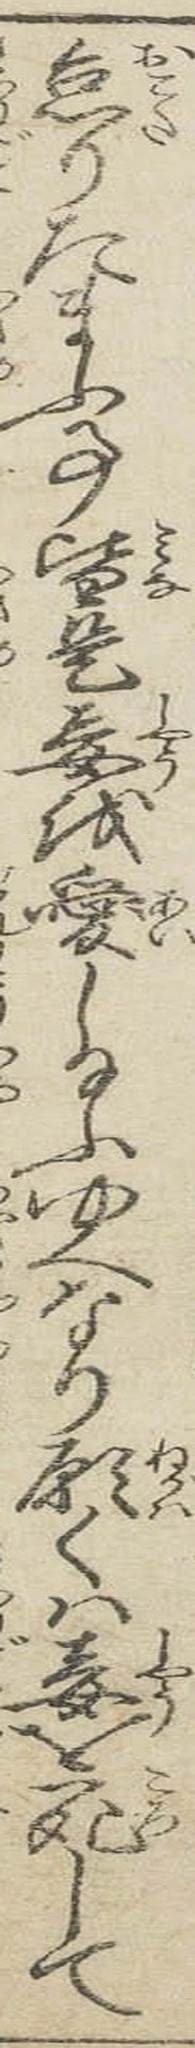怠りたまふ事皆是妾を愛し給ふゆへなり願くは妾を死して

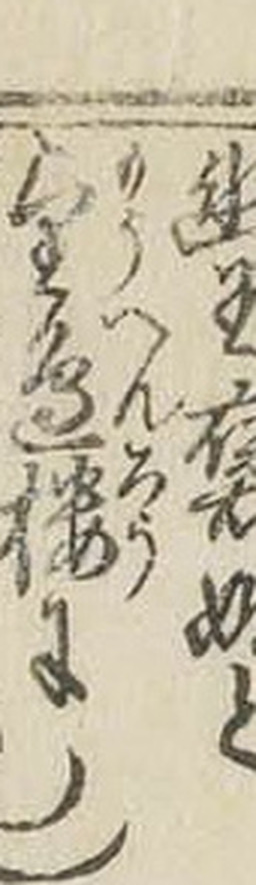望辺楼に
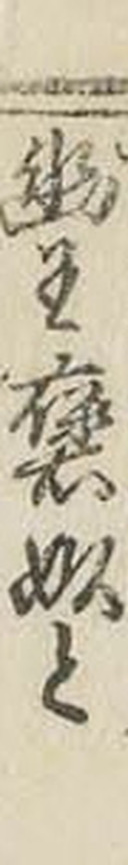幽王褒姒と
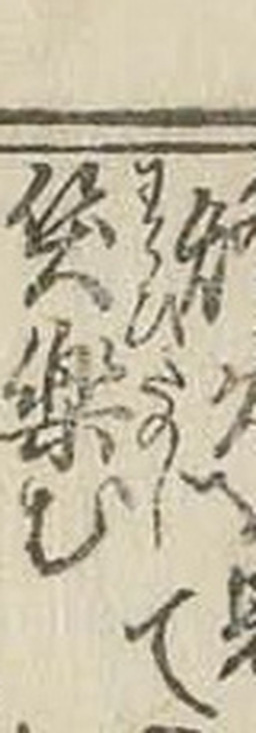笑楽む

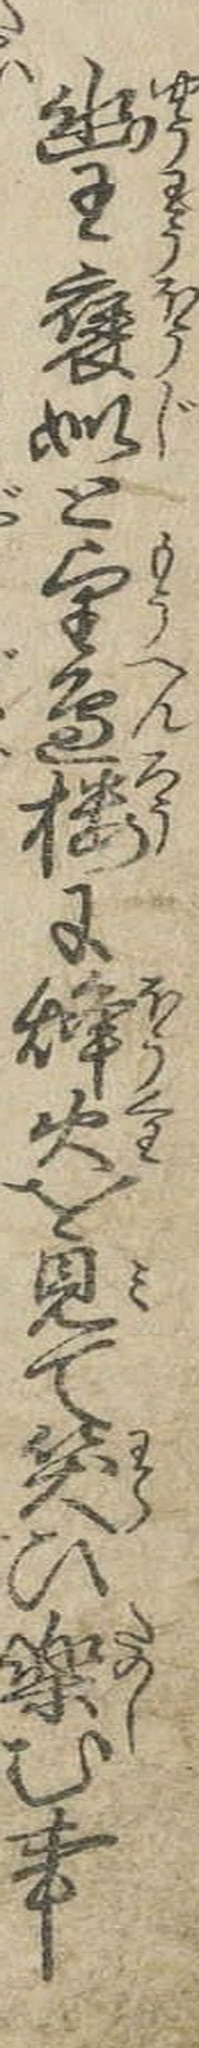幽王褒姒と望辺楼に烽火を見て笑ひ楽む事
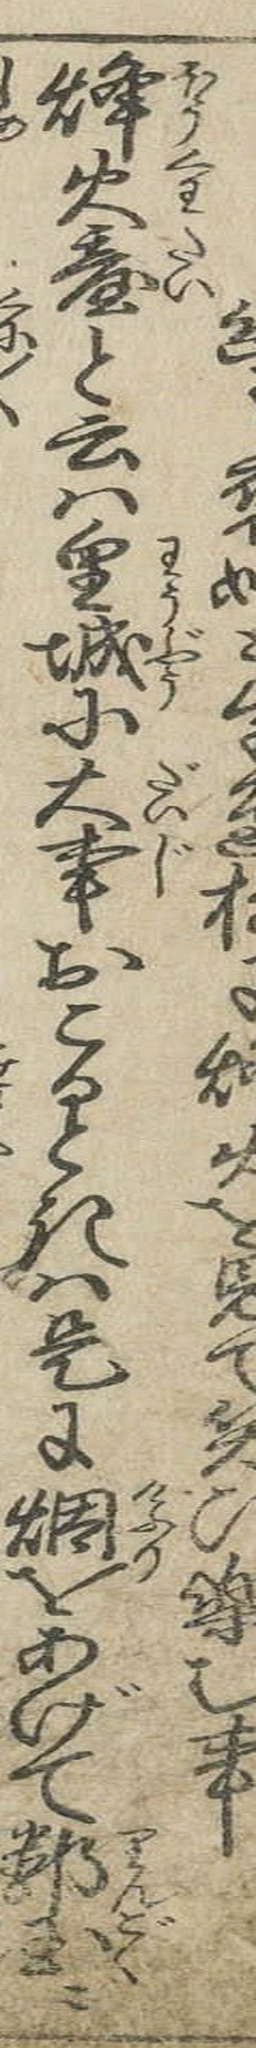烽火台と云は皇城に大事おこるときは是に烟をあげて隣国に
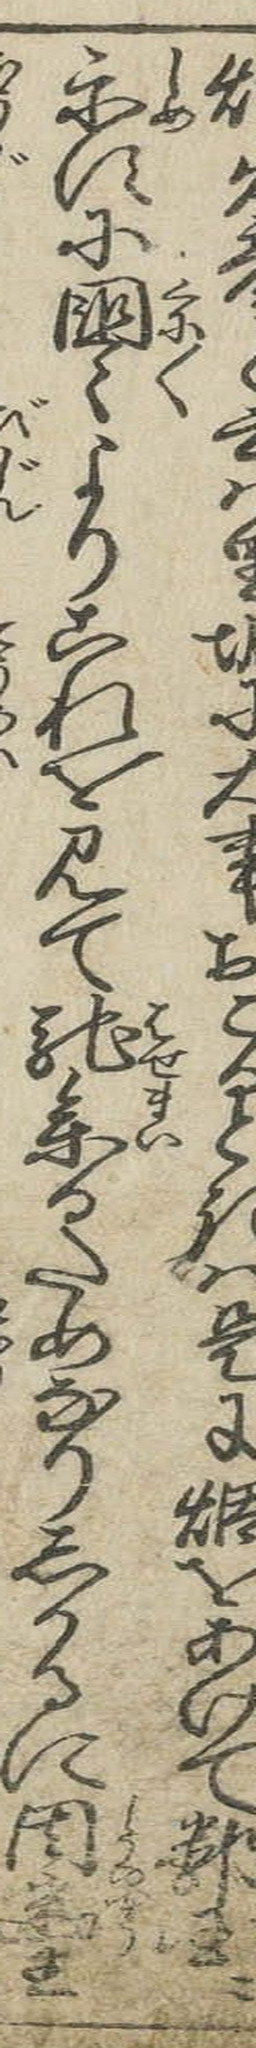示すに国々よりこれを見て馳参るためなりしかるに周幽王
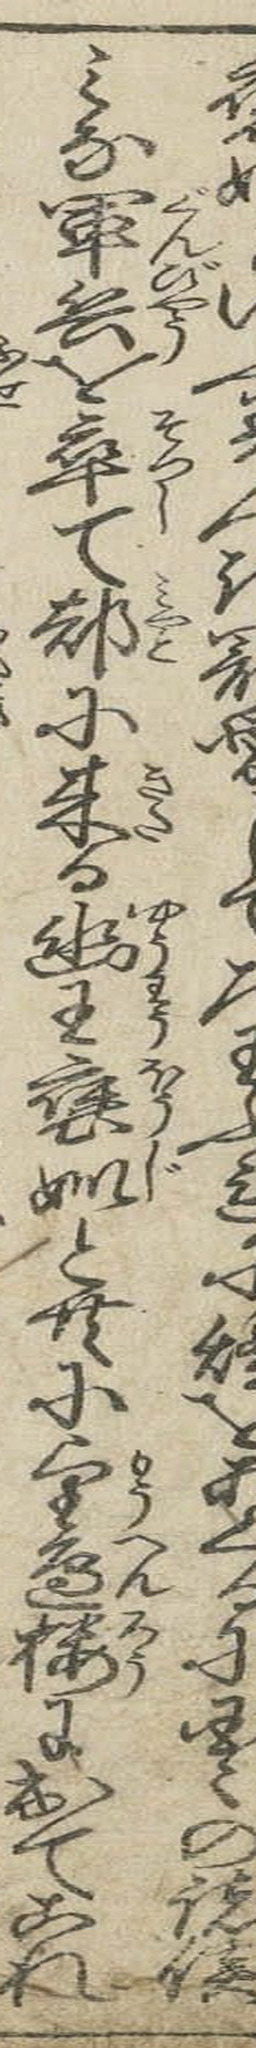みな軍兵を卒て都に来る幽王褒姒と共に望辺楼に出てこれ
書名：絵本写宝袋 9巻 5之巻
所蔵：東京学芸大学教育コンテンツアーカイブ
